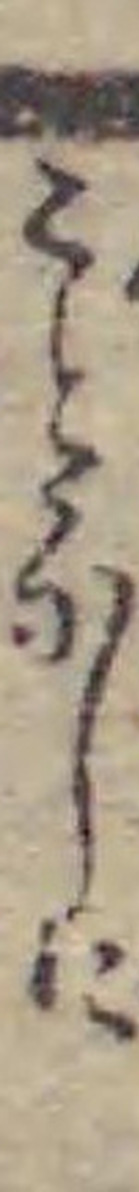ことなしに
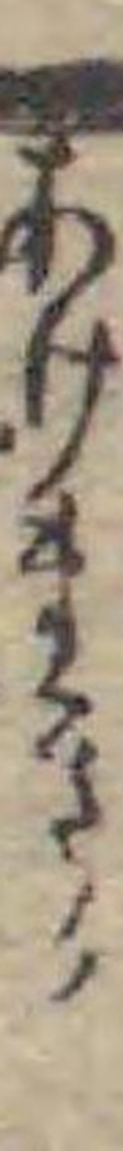すけまき
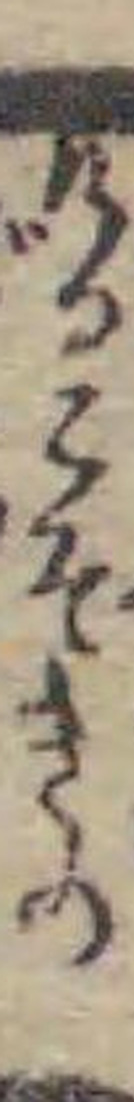けるこそきの
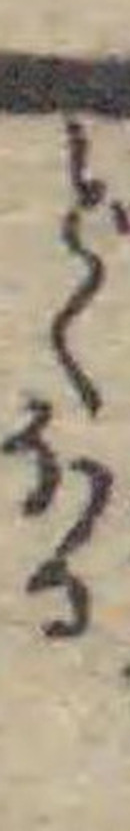どくなる
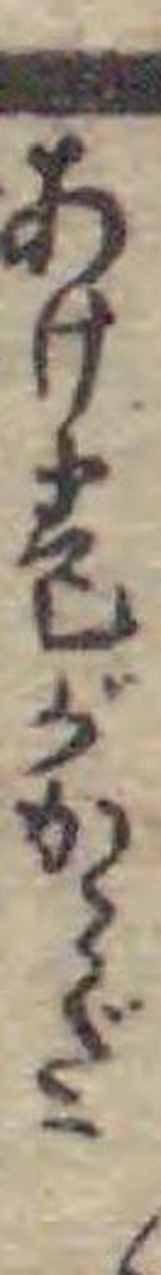あけ巻がからだ
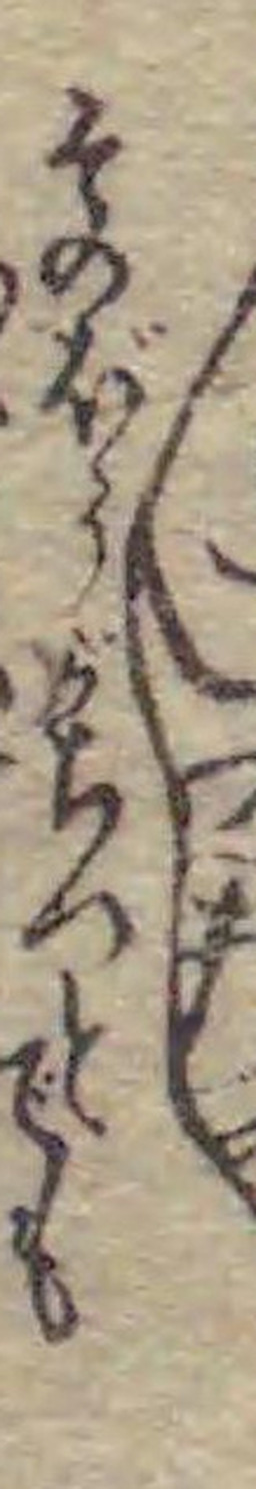そのぼうがちつとでも
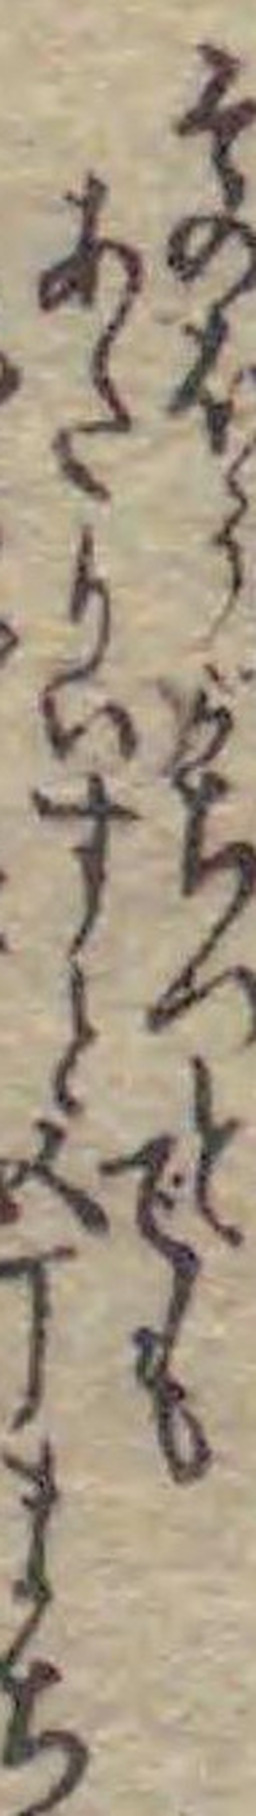あたりいすと五丁まちを
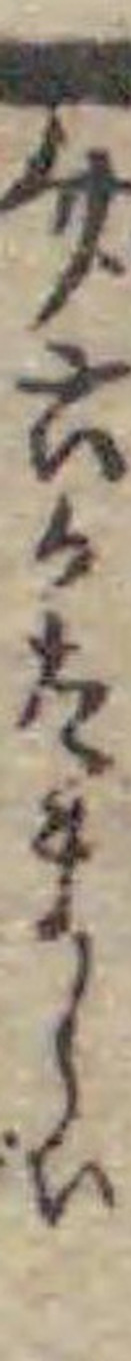介六かたましい
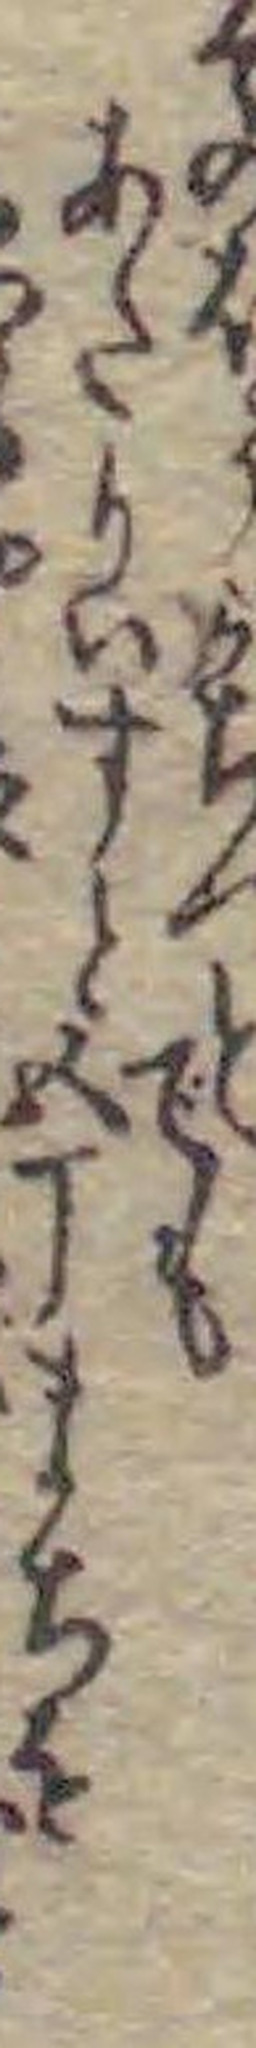あたりいすと五丁まちを
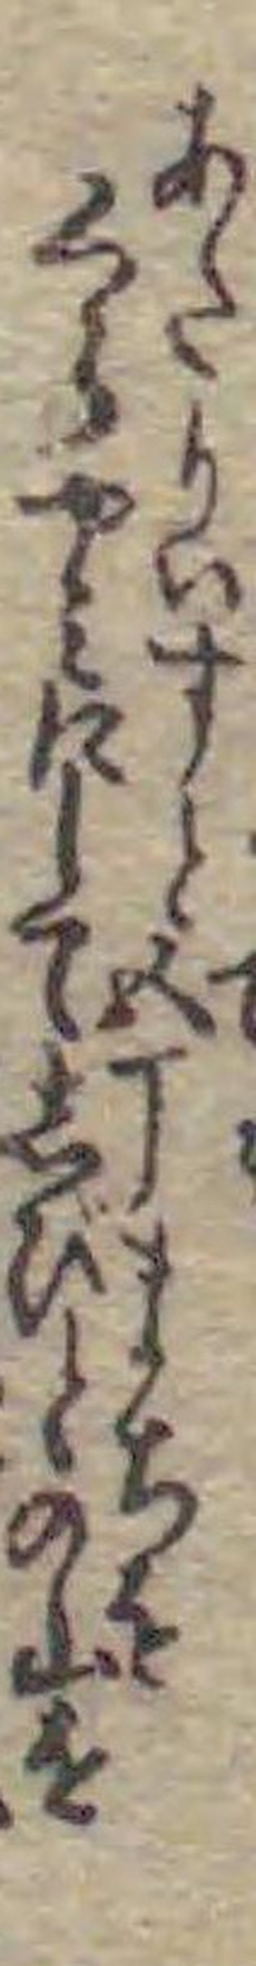くらやみにしてしびとのやまを
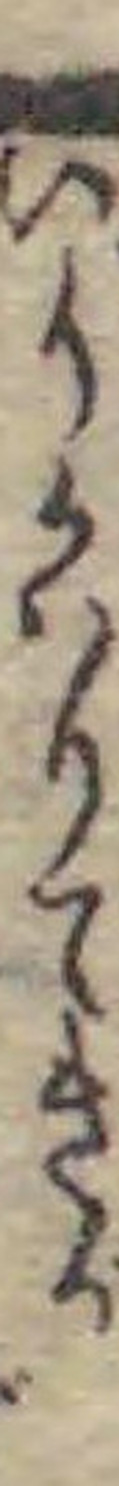いりかはりてきが
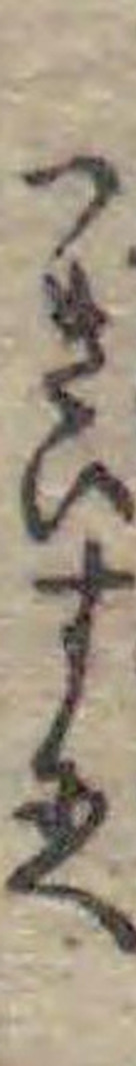つきいすにへ
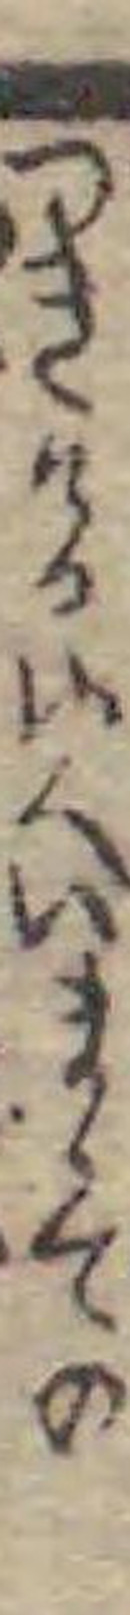つきけるゆへいまゝでの
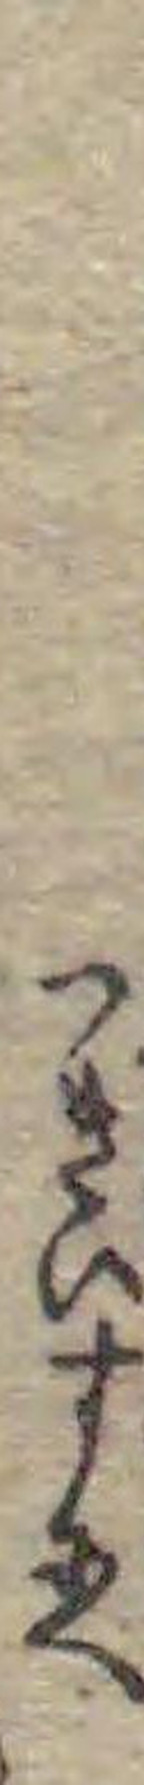つきいすにへ
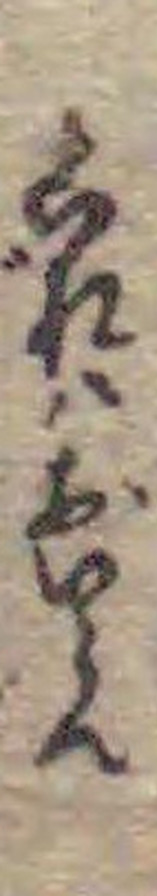これはおいらん
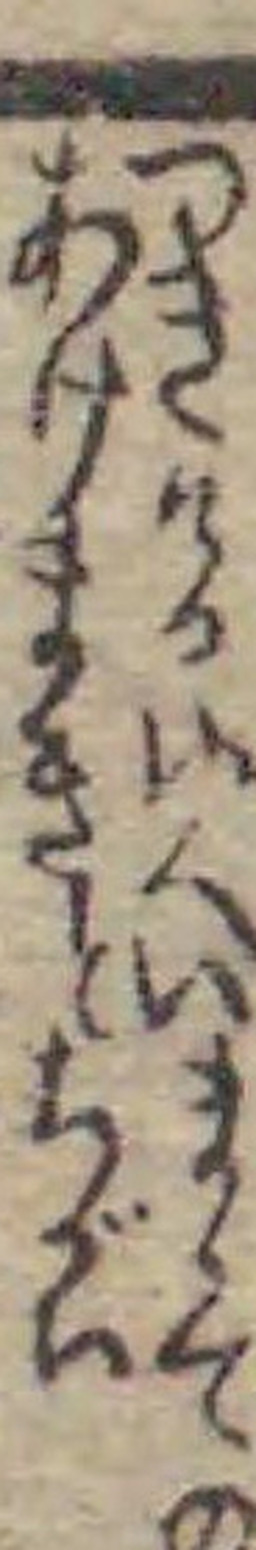あけまきとちがい
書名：江戸花俳優贔屓 : 3巻
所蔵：国立国会図書館 National Diet Library, JAPAN
